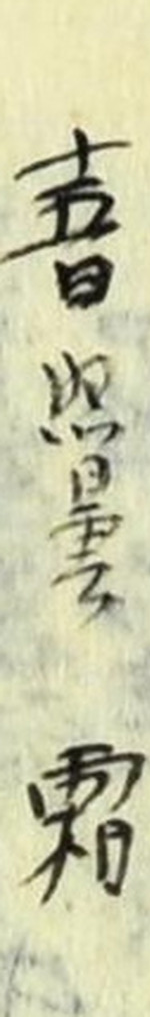十五日照曇霜
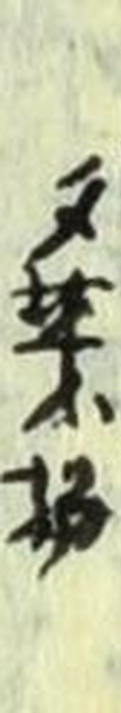夕菜揚
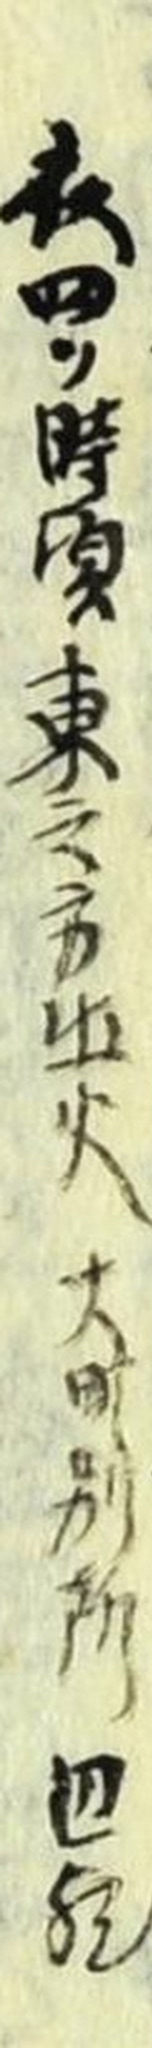夜四ツ時頃東之方出火大町別所辺歟
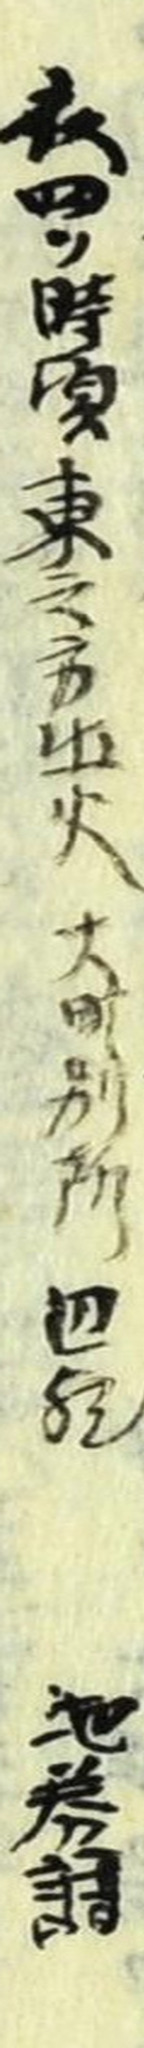夜四ツ時頃東之方出火大町別所辺歟
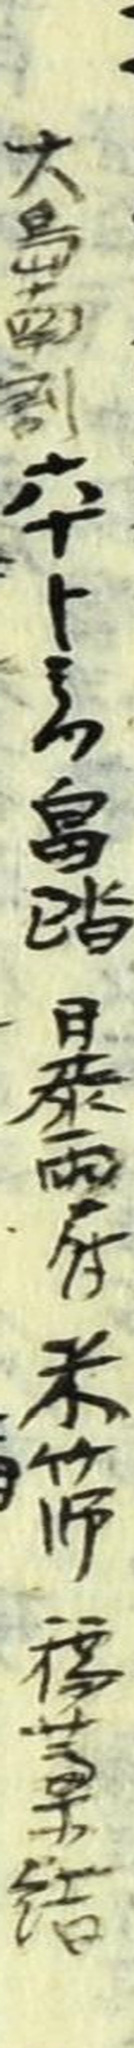大島南割六十歩之内畠踏暴雨ニ付米篩糯藁結
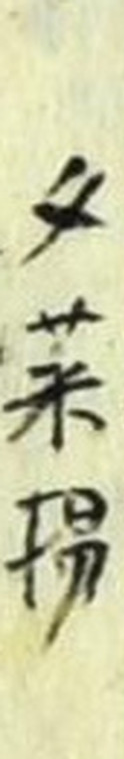夕菜揚
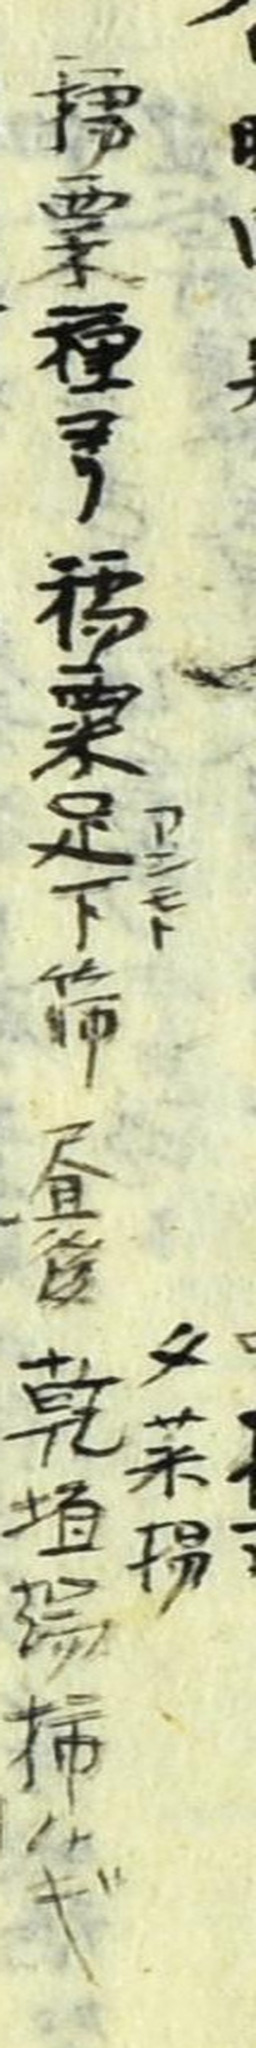糯粟種ヨリ糯粟足下篩昼後乾垣端柿ムギ
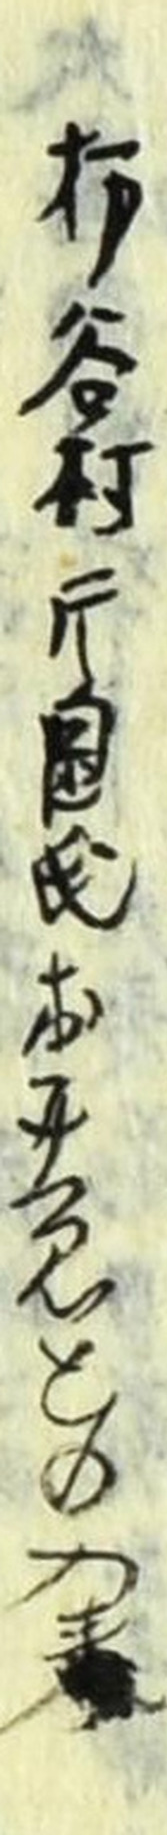栃谷村片岡氏およゑとの入来地券調

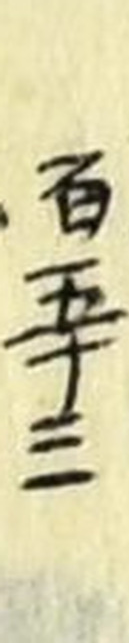百五十三
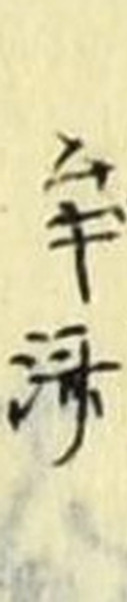ムギ済
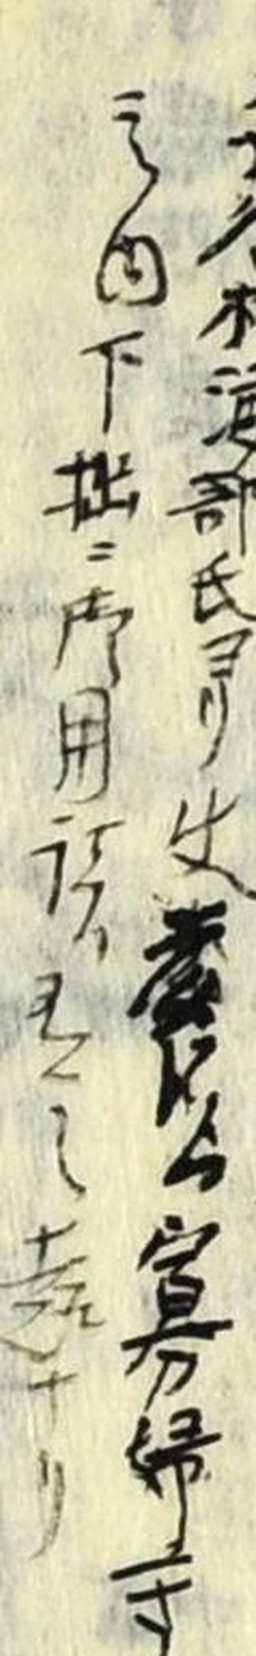之内下拙ニ御用談有之趣ナリ
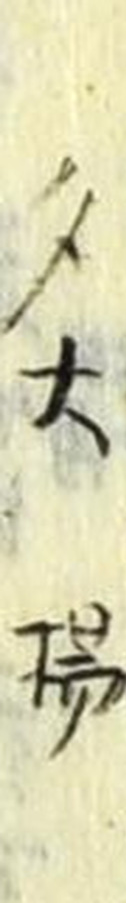夕大揚
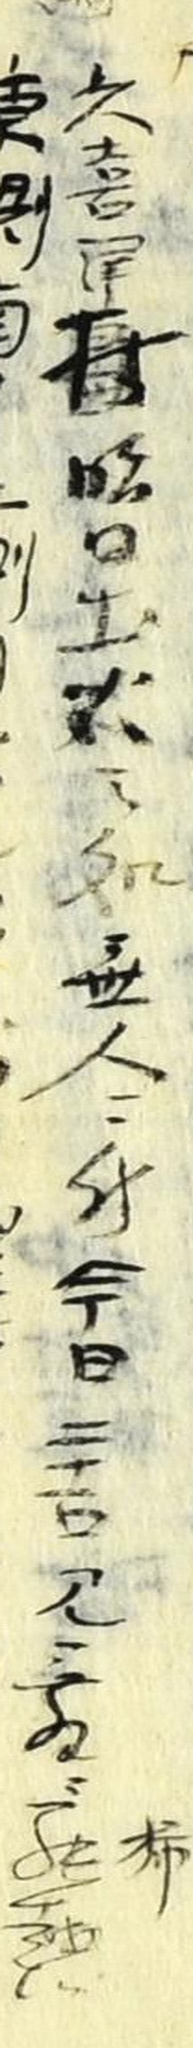久喜津村昨日出火之処無人ニ付今日二吉見舞ニ罷越候
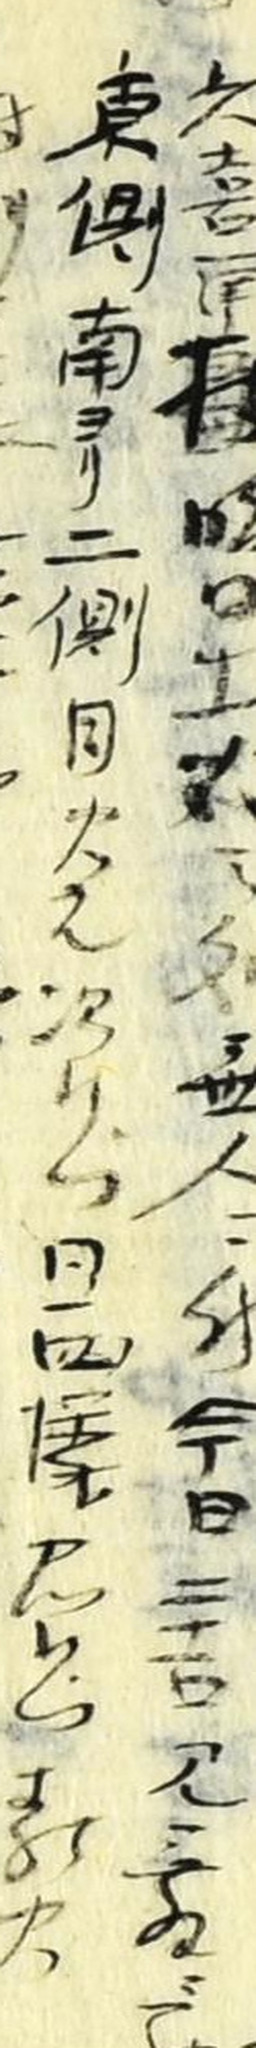東側南ヨリ二側目火元次左衛門同西隣忠左衛門類火
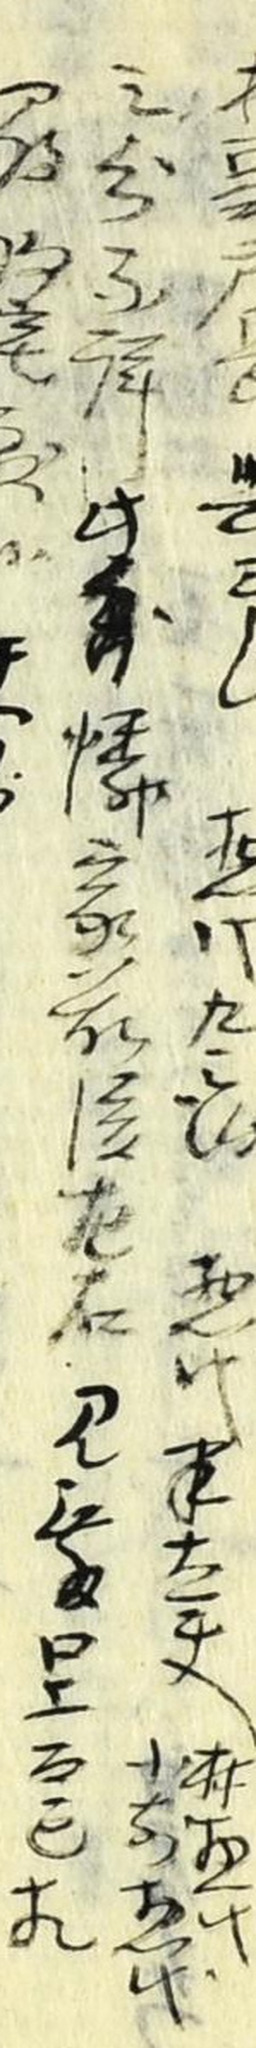之分不詳此外隣家前後左右見舞口上而已相
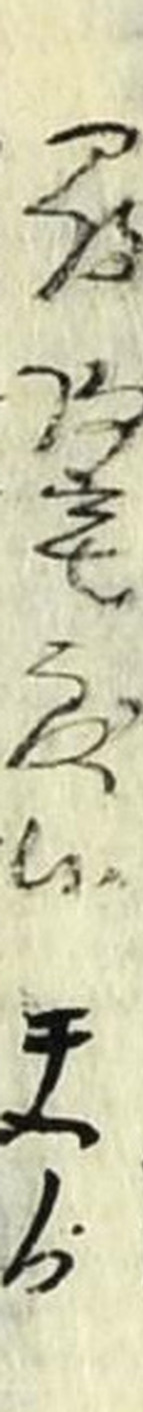尋帰宅致候夫ゟ
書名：（日記）
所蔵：福井県文書館 Fukui Prefectural Archives
